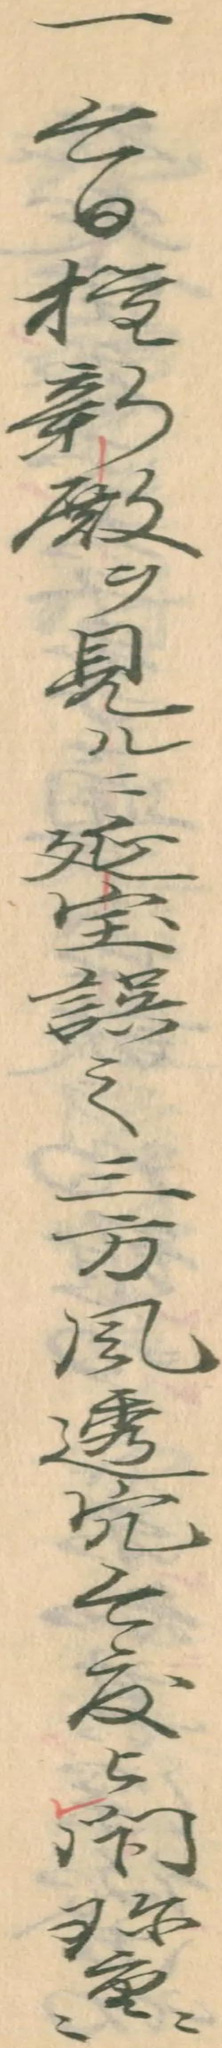一今日権新-殿ヲ見ルニ延-宝誤之三方風透穴今度被閇珍重々々
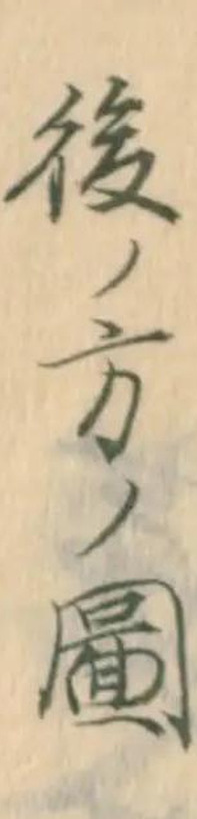後ノ方ノ図
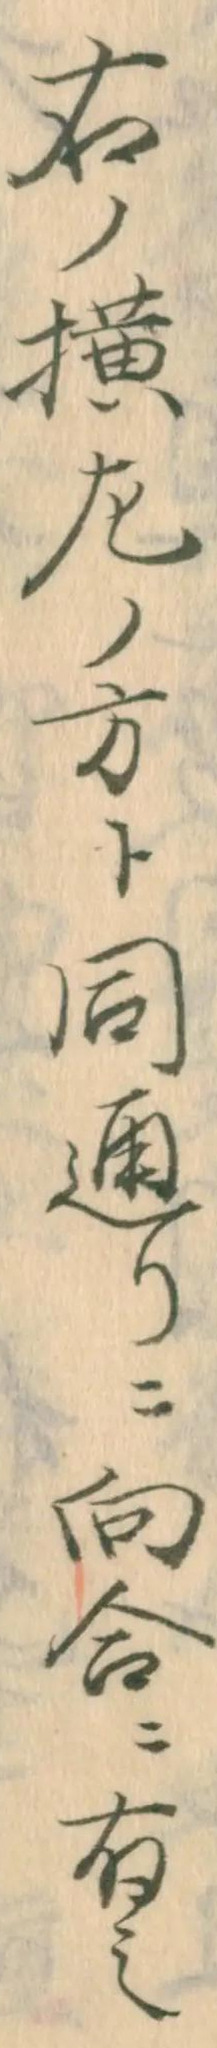右ノ横左ノ方ト同通リニ向_合ニ有之
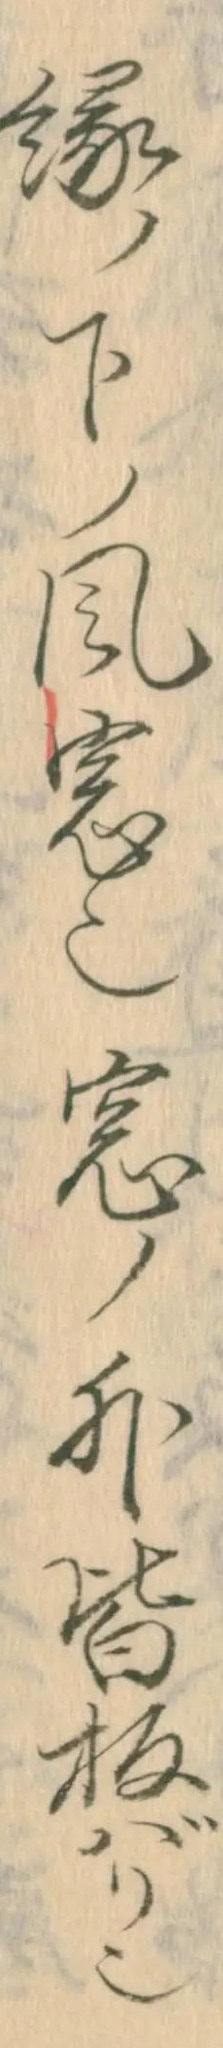窓縁ノ下ノ風_窓也窓ノ外皆板バリ也
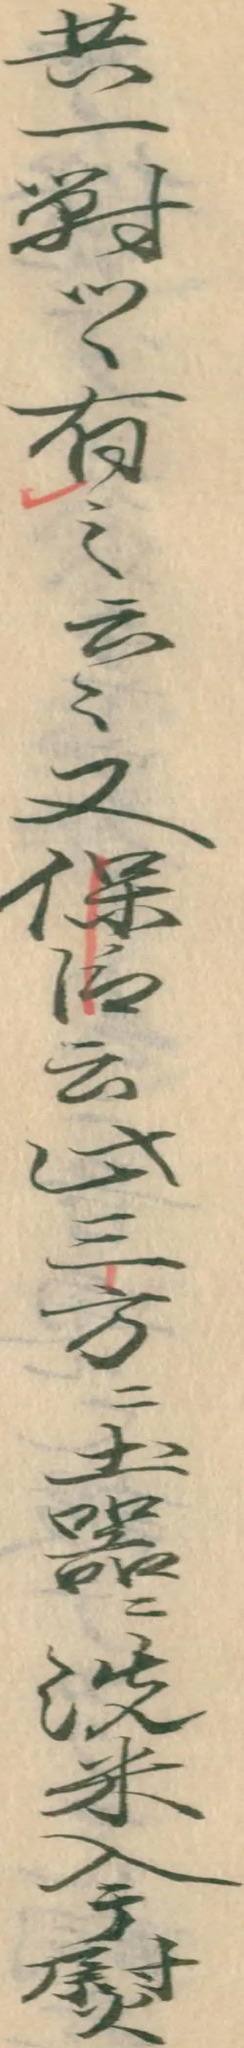共一対ツヽ有之云々又保臣云此三-方ニ土器ニ洗米入テ熨
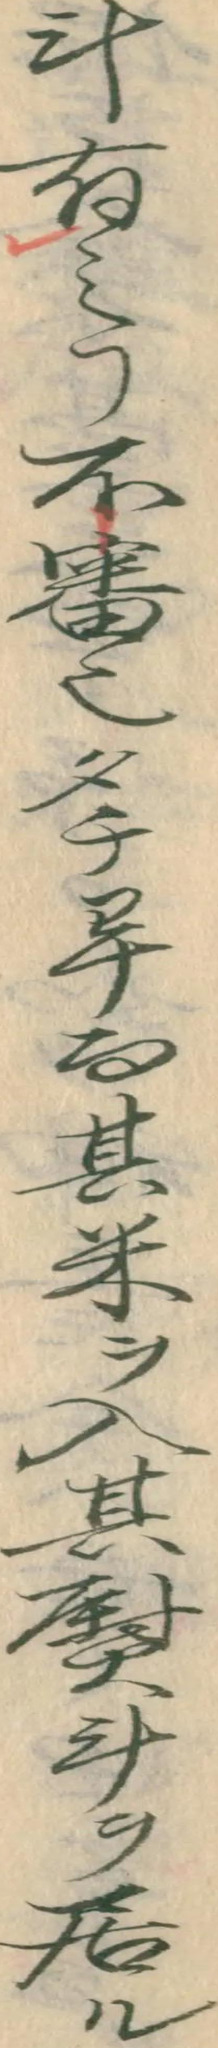斗有之コト不-審也タチ畢而其米ヲ入其熨斗ヲ居ル
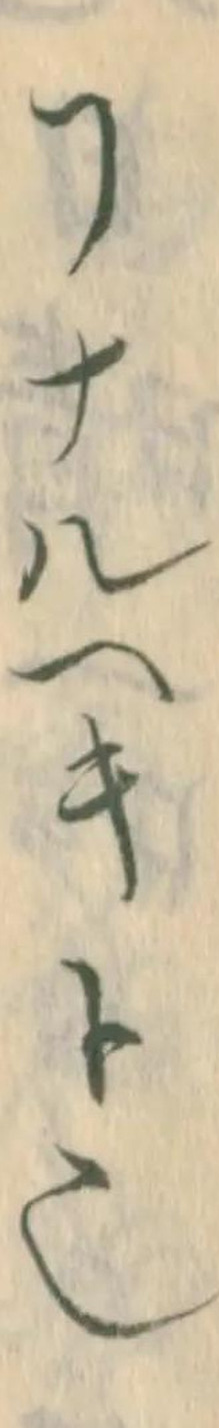コトナルヘキト也
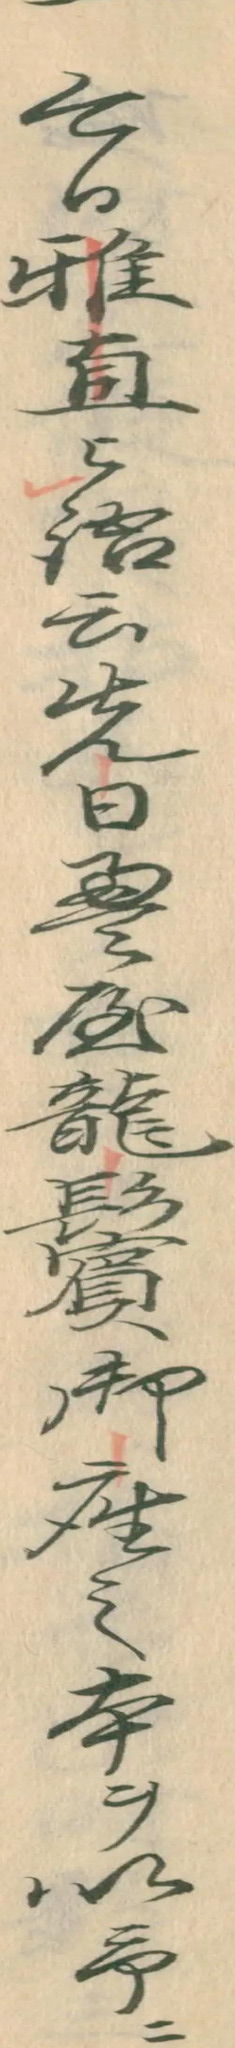一今日雅直被語云先-日畳屋龍-鬢御-座之本ヲ以予ニ
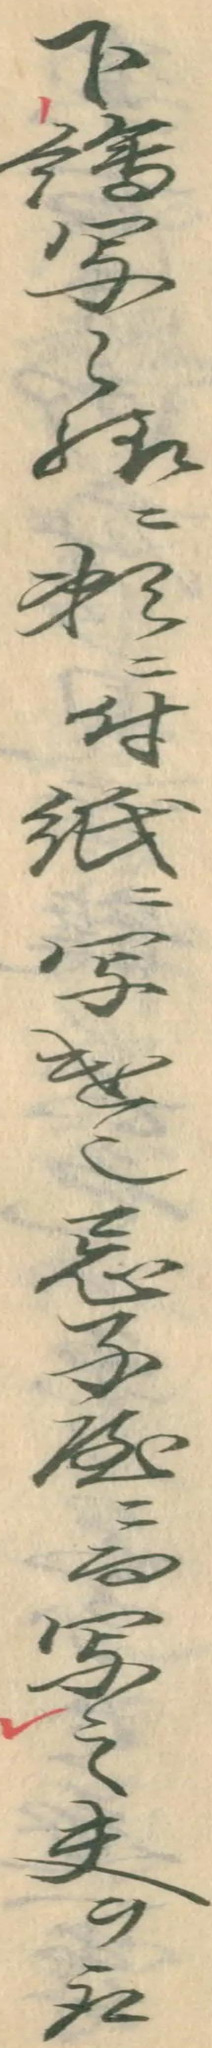下_絵写候様二頼二付紙ニ写遣也忌子屋二而写之夫ヲ取
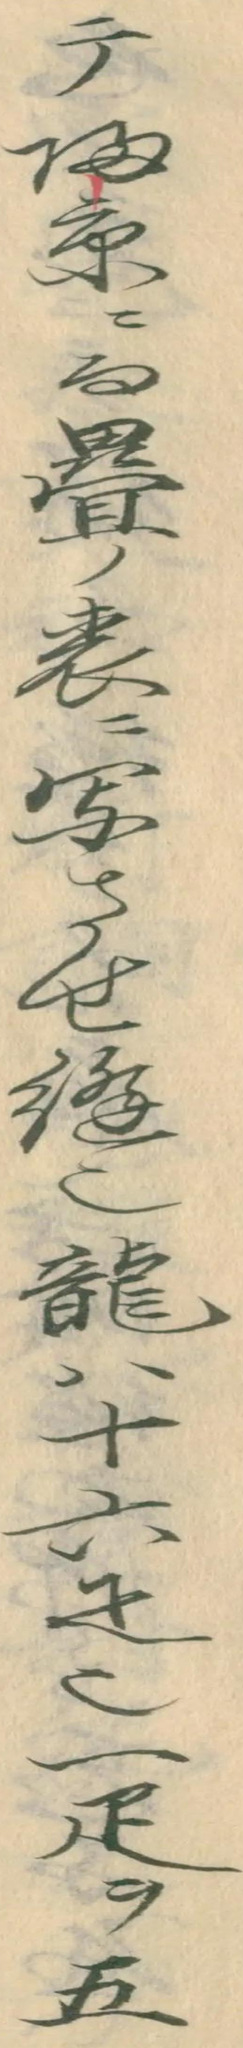テ帰-京ニ而畳ノ表ニ写させ縫也龍ハ十六疋也一疋ヲ五

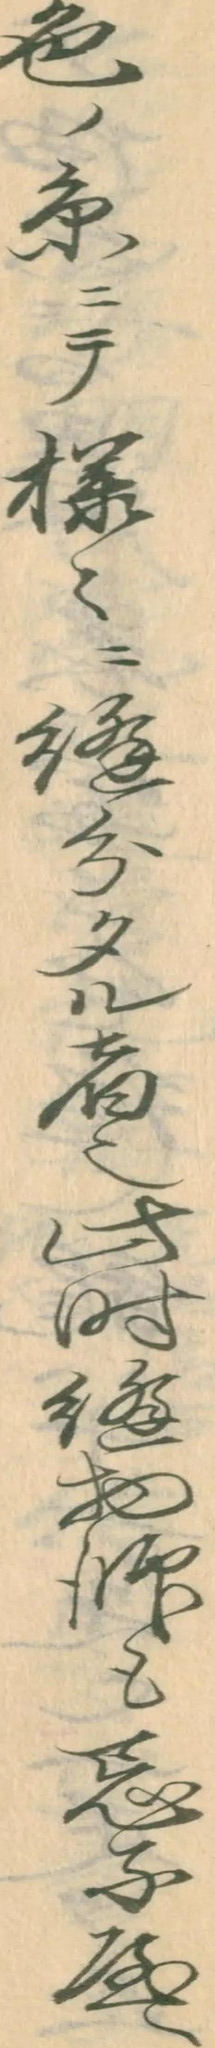色ノ糸ニテ様々ニ縫分タル者也此時縫物師も忌子屋へ
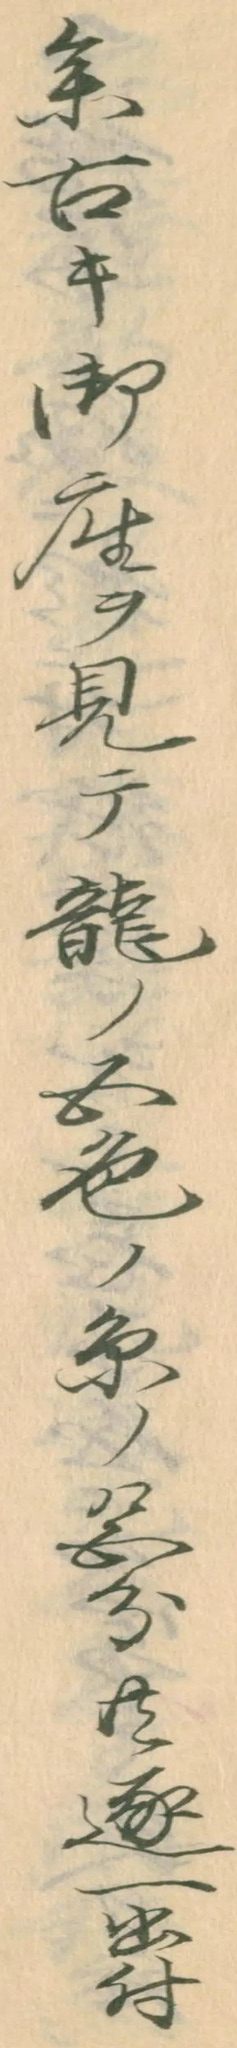参古キ御座ヲ見テ龍ノ五色ノ糸ノ色分共逐一書付
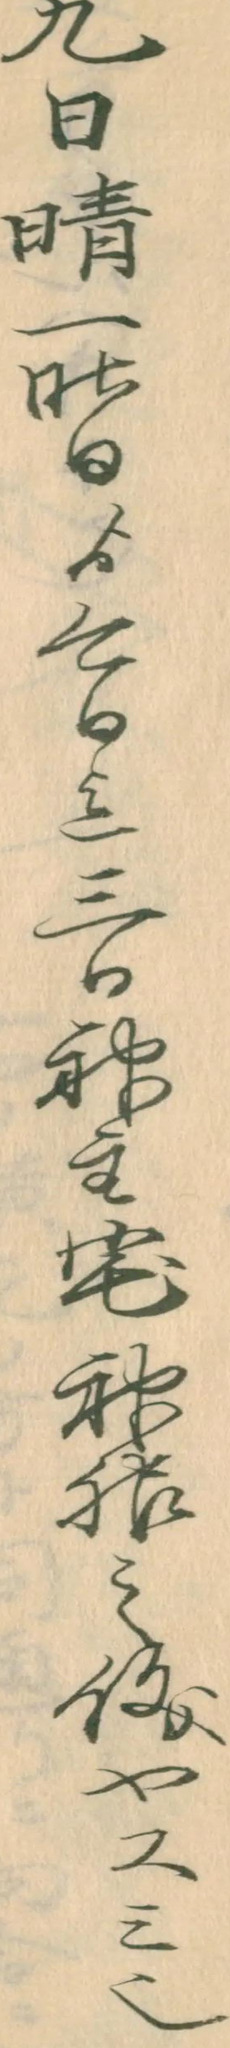九日晴一昨日ゟ今日迄三日神主宅神服之儀ヤスミ也
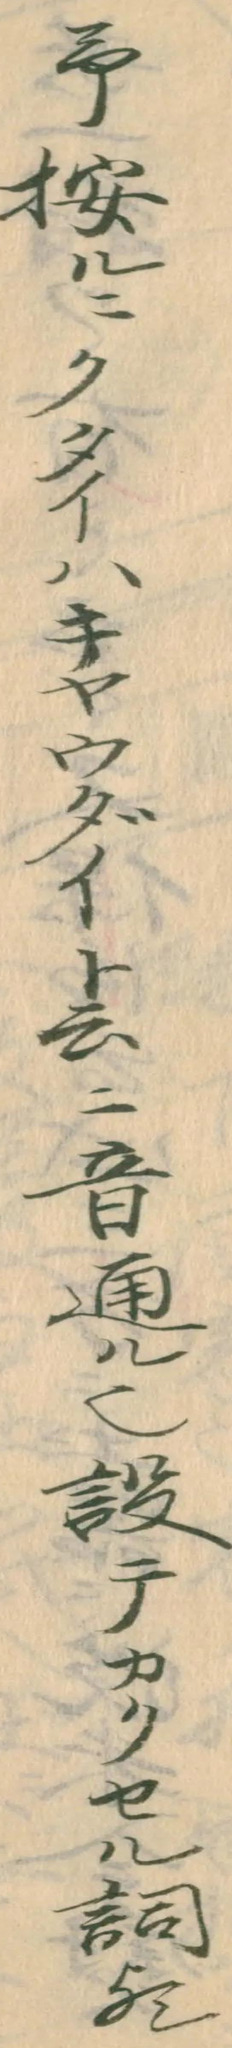予按ルニクタイハキヤウダイト云ニ音通ル也設テカクセル詞歟
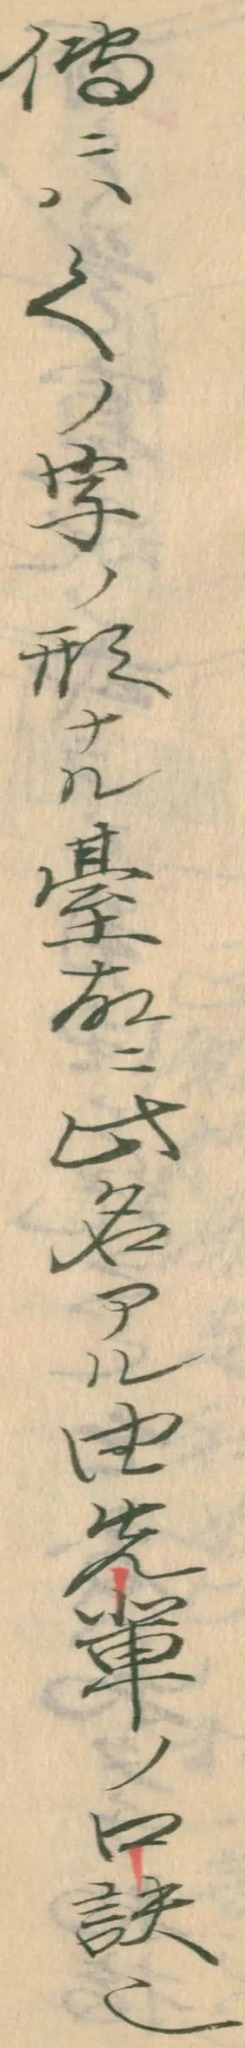伝ニハくノ字ノ形ナル台故ニ此名アル由先-輩ノ口-訣也
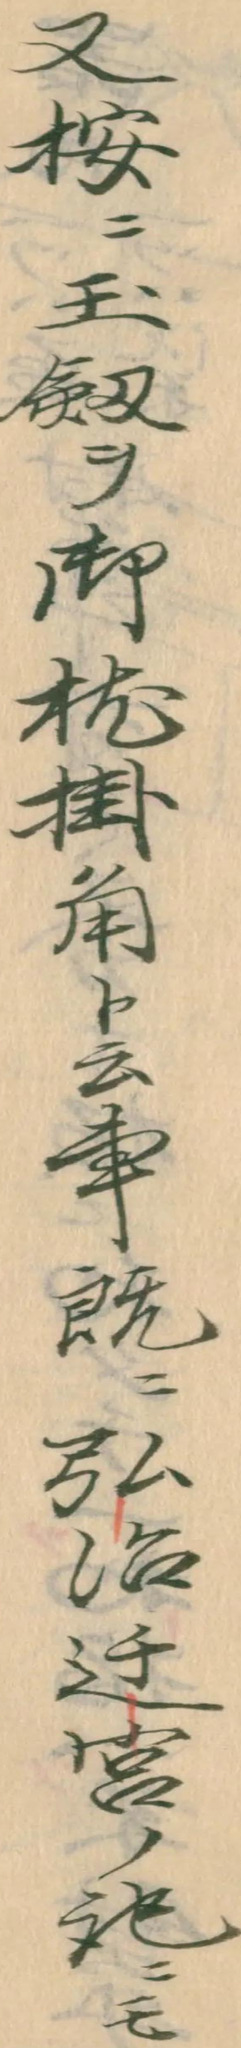又按ニ玉剱ヲ御枕掛角ト云事既ニ弘-治迁-宮ノ記ニモ
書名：賀茂社記録. 第15冊
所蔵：国立国会図書館 National Diet Library, JAPAN
